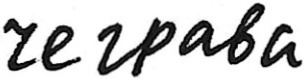чеграва
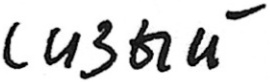сизый
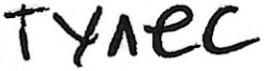тулес
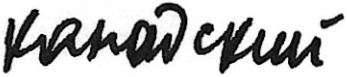канадский
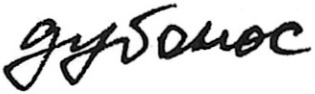дубонос
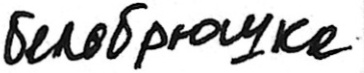белобрюшка
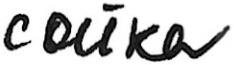сойка
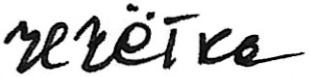чечётка
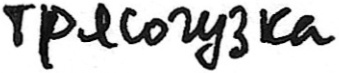трясогузка
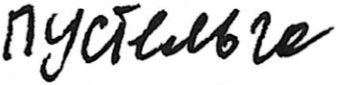пустельге
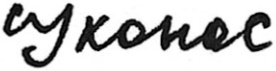сухонос
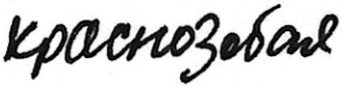краснозобая
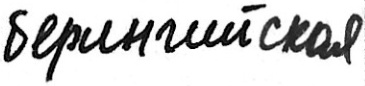берингийская
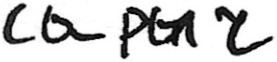сарыч
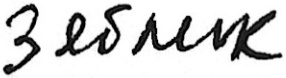зяблик
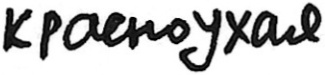красноухая
